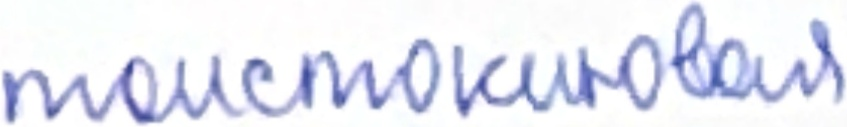толстоклювая
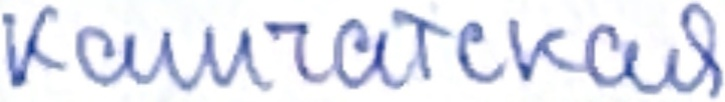камчатская
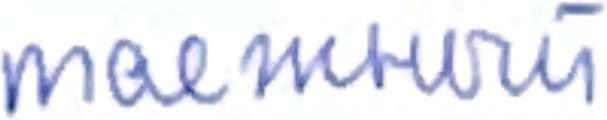таежный
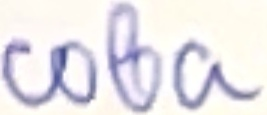сова
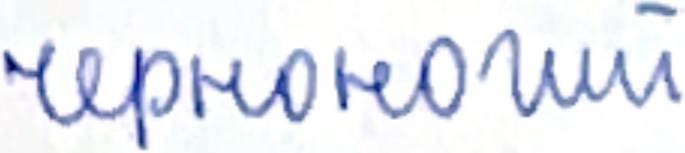черноногий
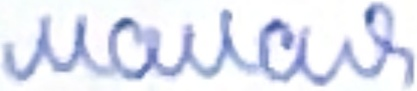малая
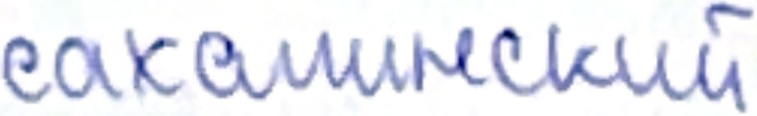сахалинский
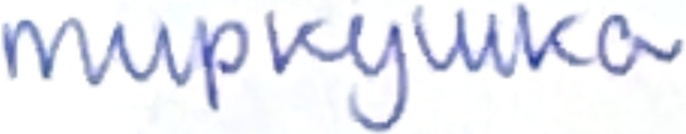тиркушка
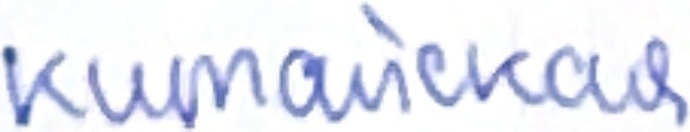китайская
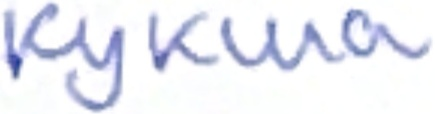кукша
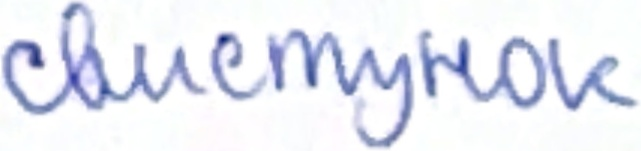свистунок
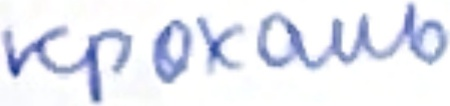крохаль
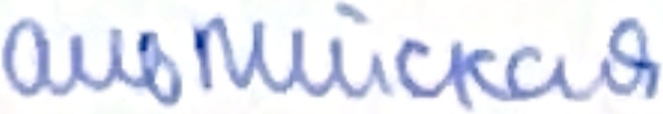альпийская
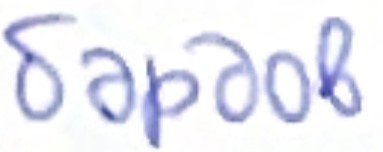бэрдов
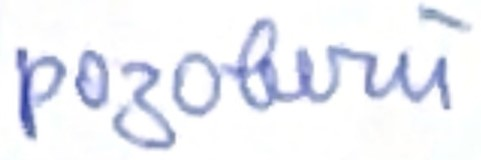розовый
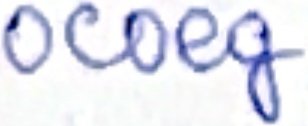осоед
